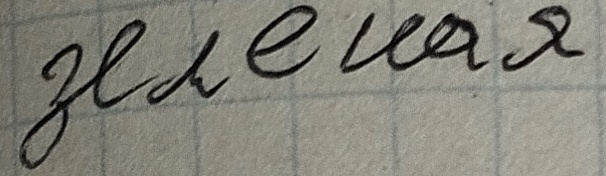зеленая
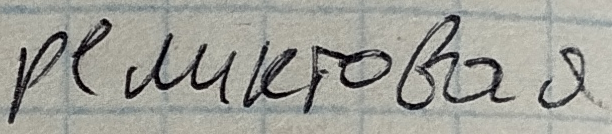реликтовая
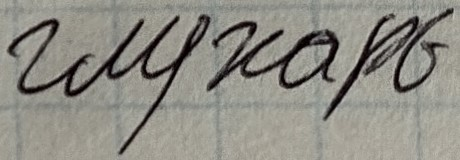глухарь
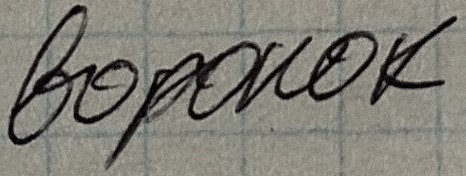воронок
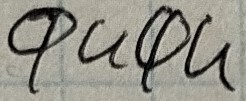фифи
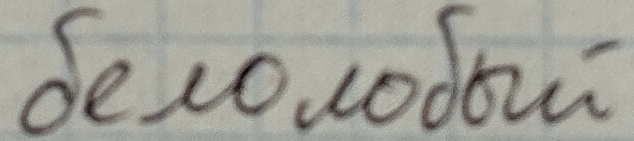белолобый
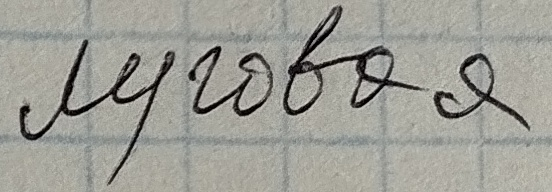луговая
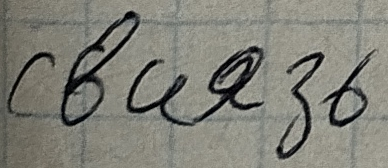свиязь
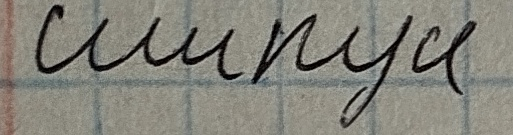шипун
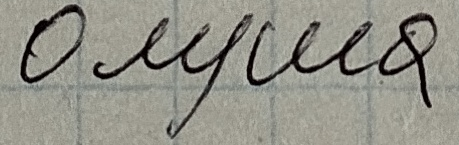олуша
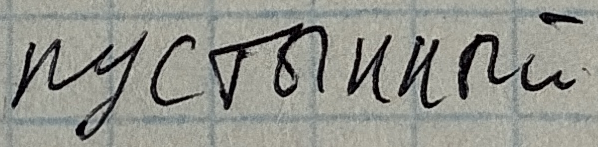пустынный
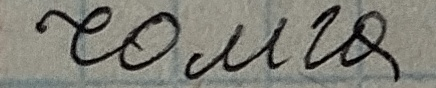чомга
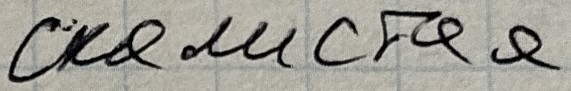скалистая
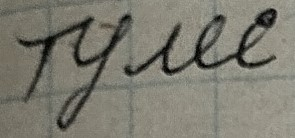тулес
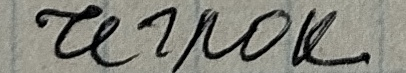чеглок
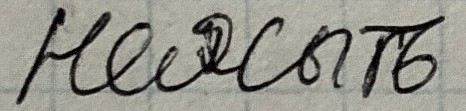неясыть
